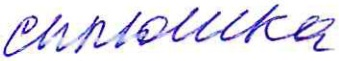сплюшка
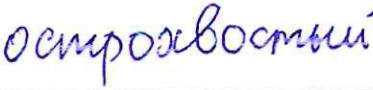острохвостый
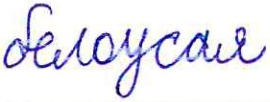белоусая
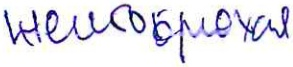желтобрюхая
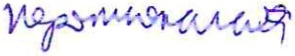керяткопалая
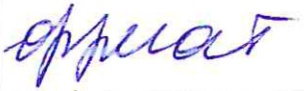фрегат
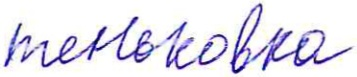теньковка
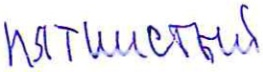пятнистый
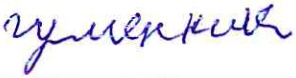гуменник
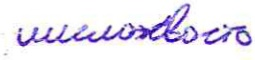шилохвость
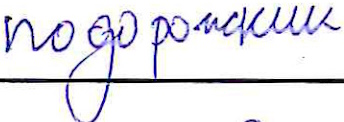подорожник
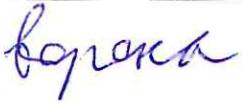ворона
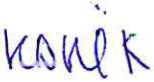конёк
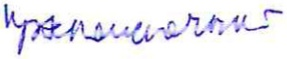крхпошпочний
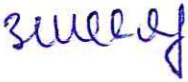змееяд
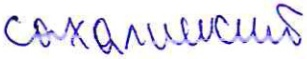сахалинсий
